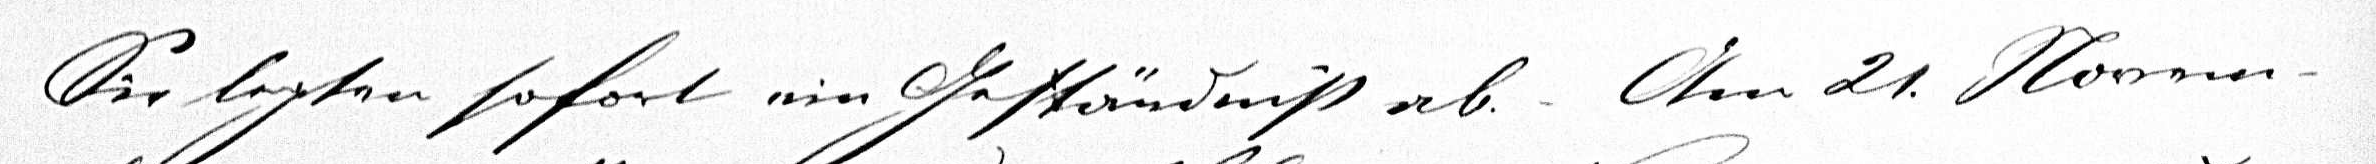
Sie legten sofort ein Geständniß ab. Am 21. Novem¬
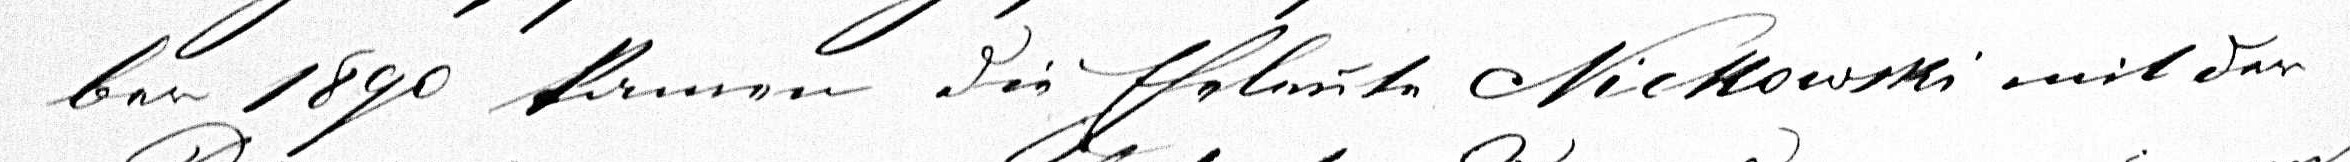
ber 1890 kamen die Eheleute Nickowski mit der
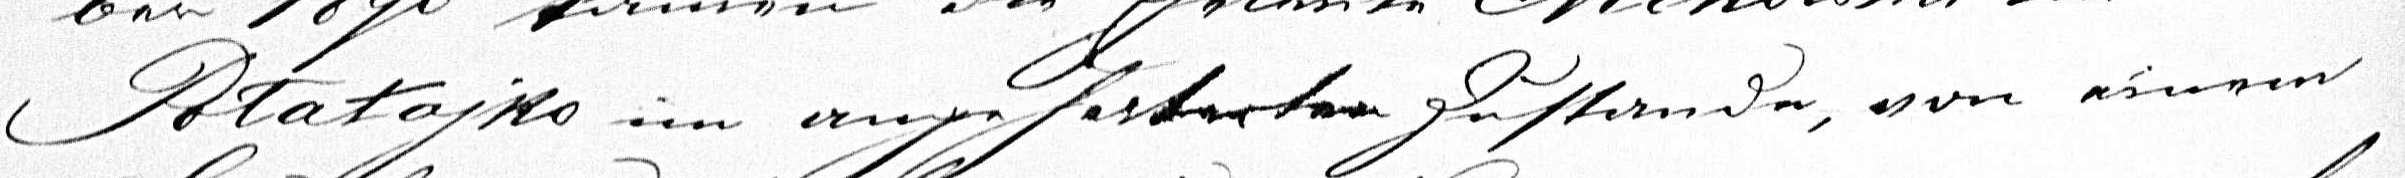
Połatajko im angeheiterten Zustande, von einem
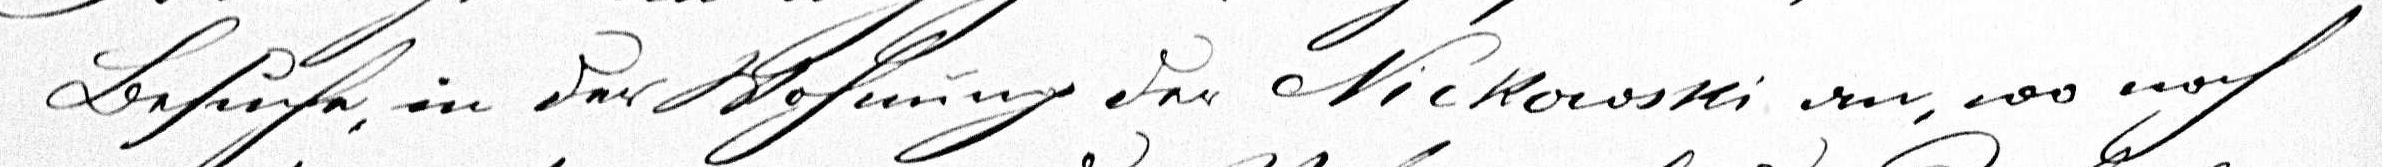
Besuche in der Wohnung der Nickowski an, wo noch
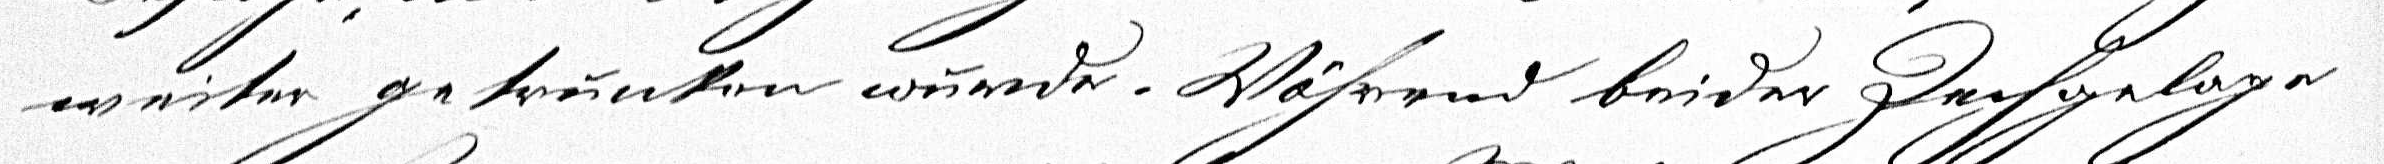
weiter getrunken wurde. Während beider Zechgelage
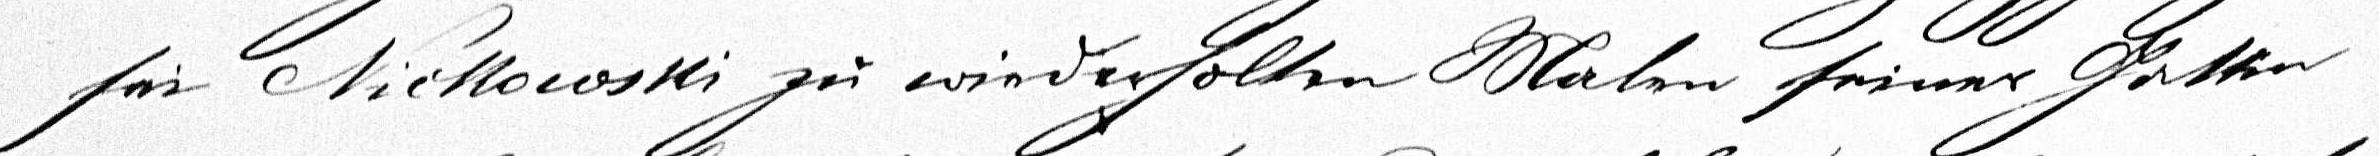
[carousal, spree] sei Nickowski zu wiederholten Malen seiner Gattin
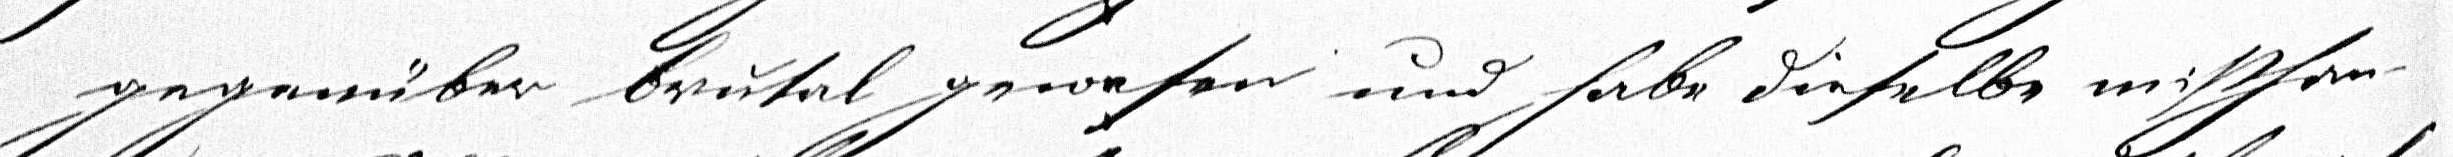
gegenüber brutal gewesen und habe dieselbe mißhan¬
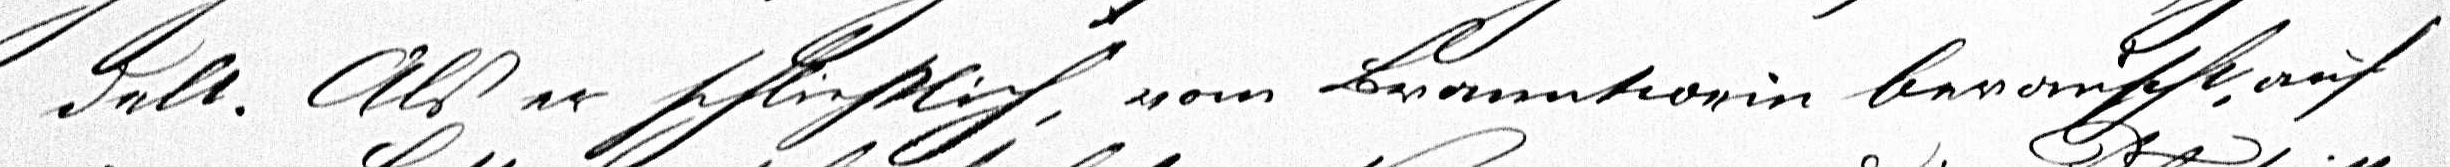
delt. Als er schließlich, vom Branntwein berauscht, auf
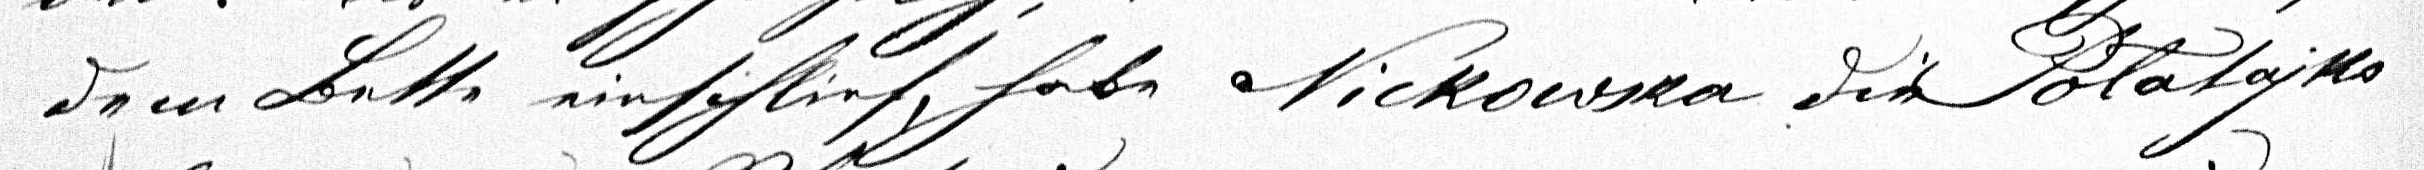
dem Bette einschlief, habe Nickowska die Połatajko
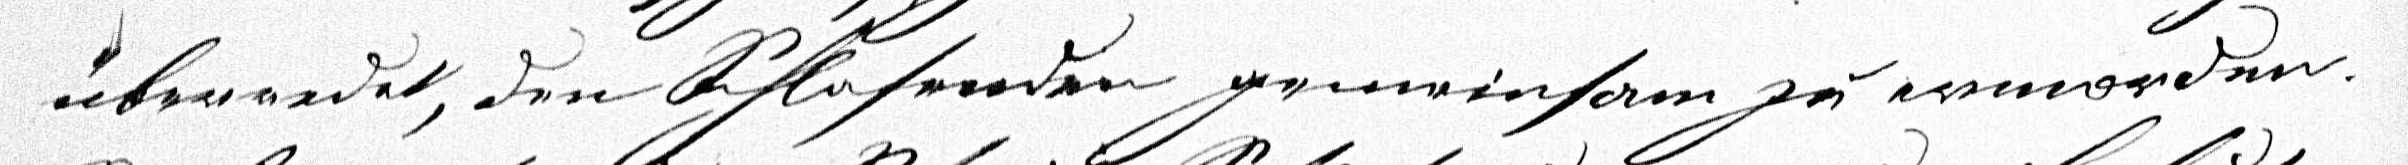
überredet, den Schlafenden gemeinsam zu ermorden.
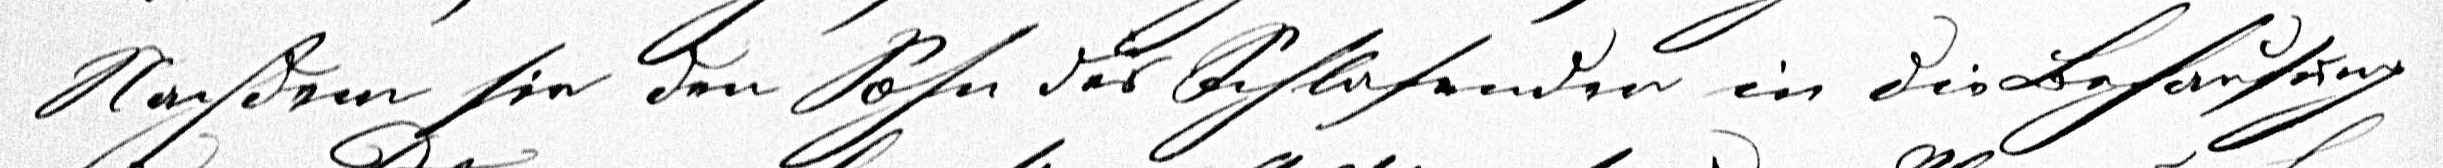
Nachdem sie den Sohn des Schlafenden in die Behausung
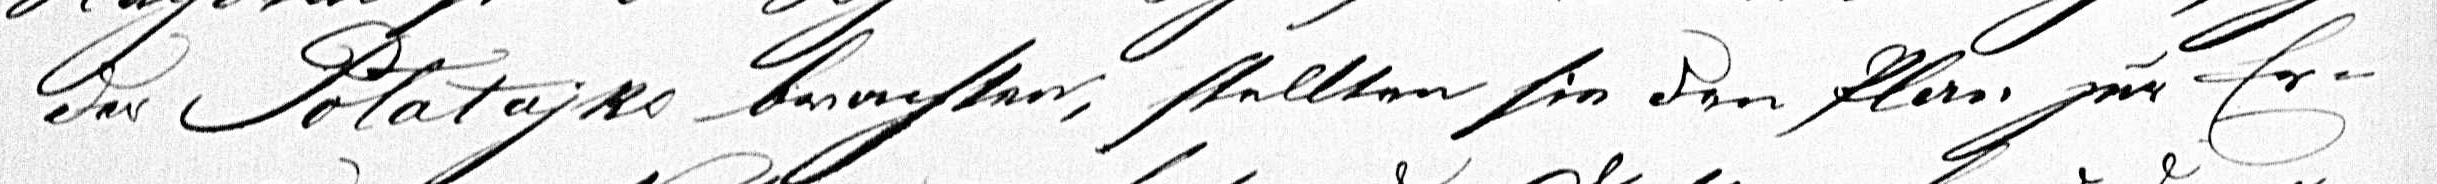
der Połatajko brachten, stellten sie den Plan zur Er¬
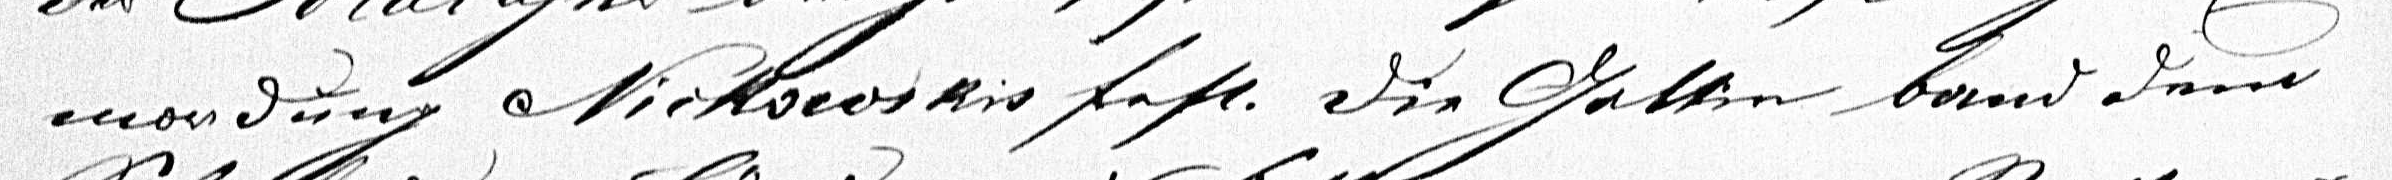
mordung Nickowski fest. Die Gattin band dem
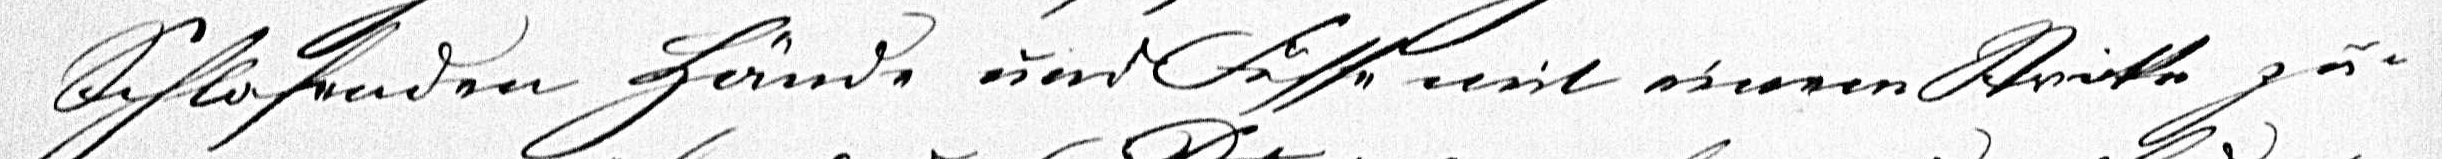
Schlafenden Hände und Füsse mit einem Stricke zu¬
